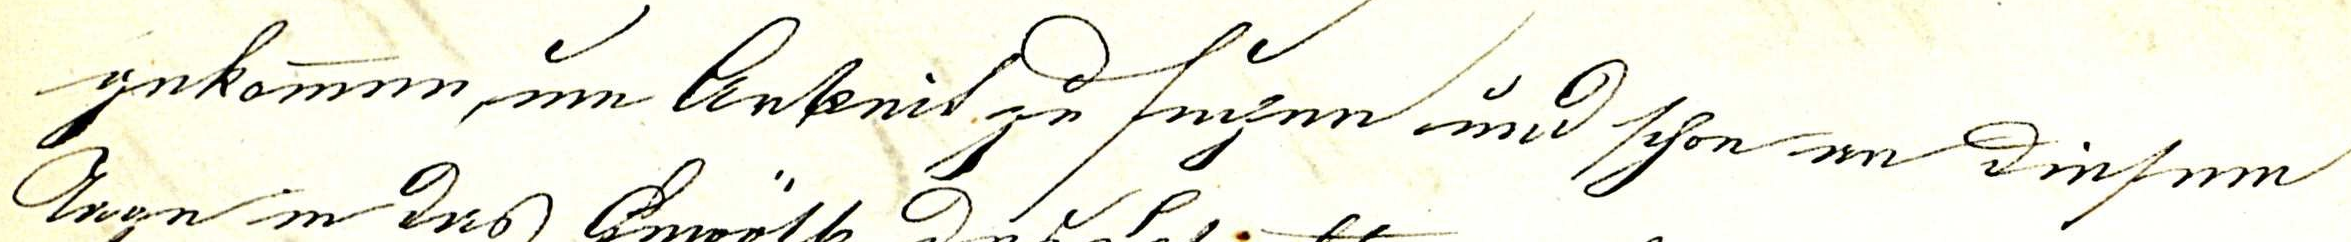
gekommen um Arbeit zu suchen und schon an diesem
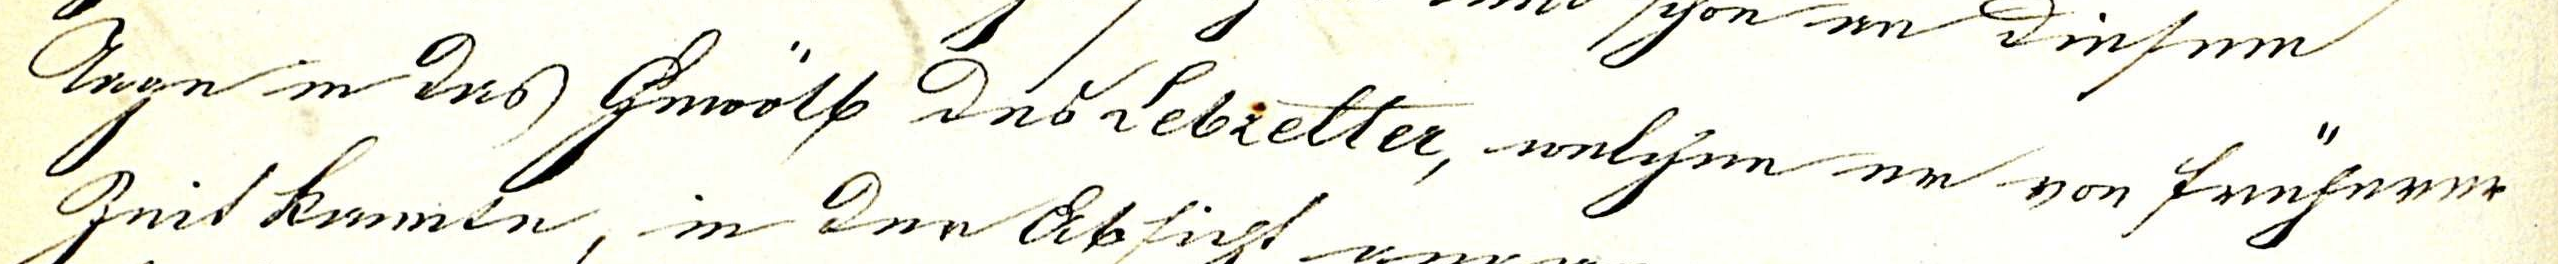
Tage in das Gewölb des Lebzelter, welchen er von früherer
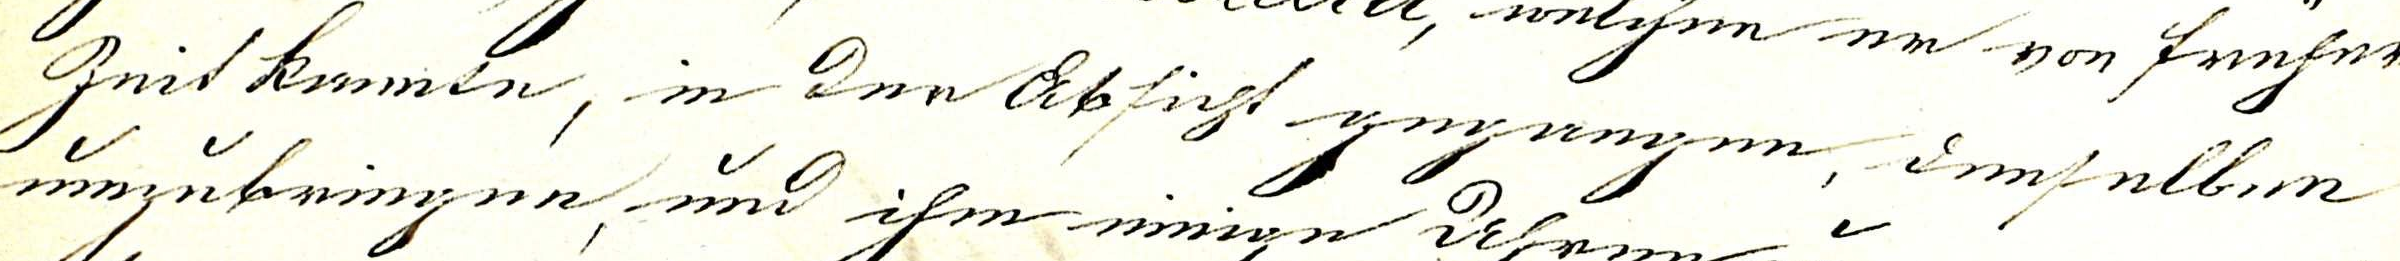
Zeit kannte, in der Absicht gegangen, denselben
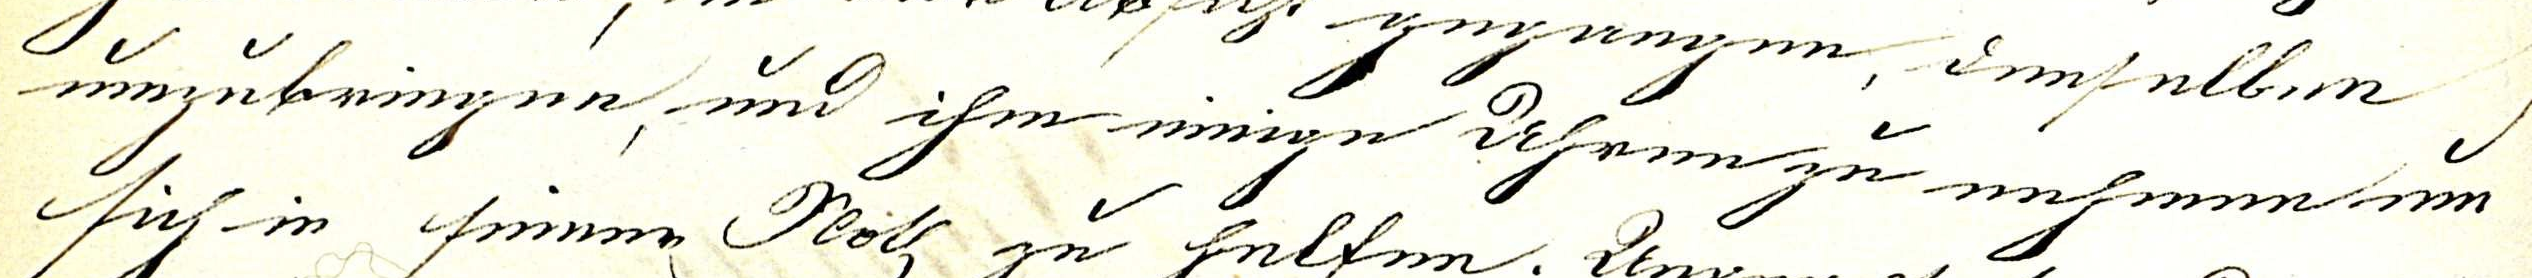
umzubringen, und ihm einige Uhren zu nehmen um
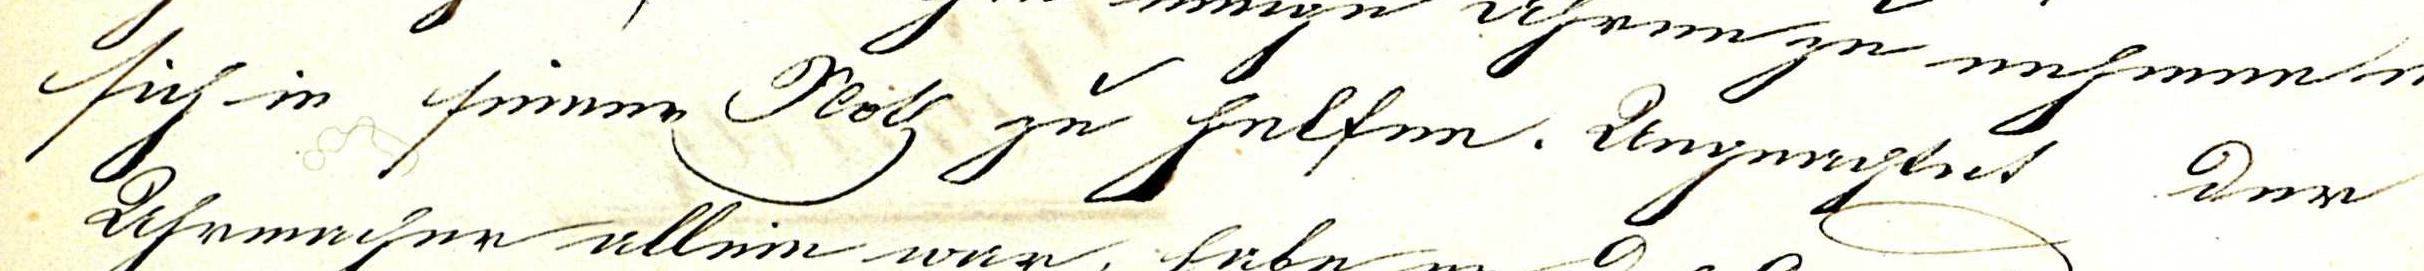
sich in seiner Noth zu helfen. Ungeachtet der
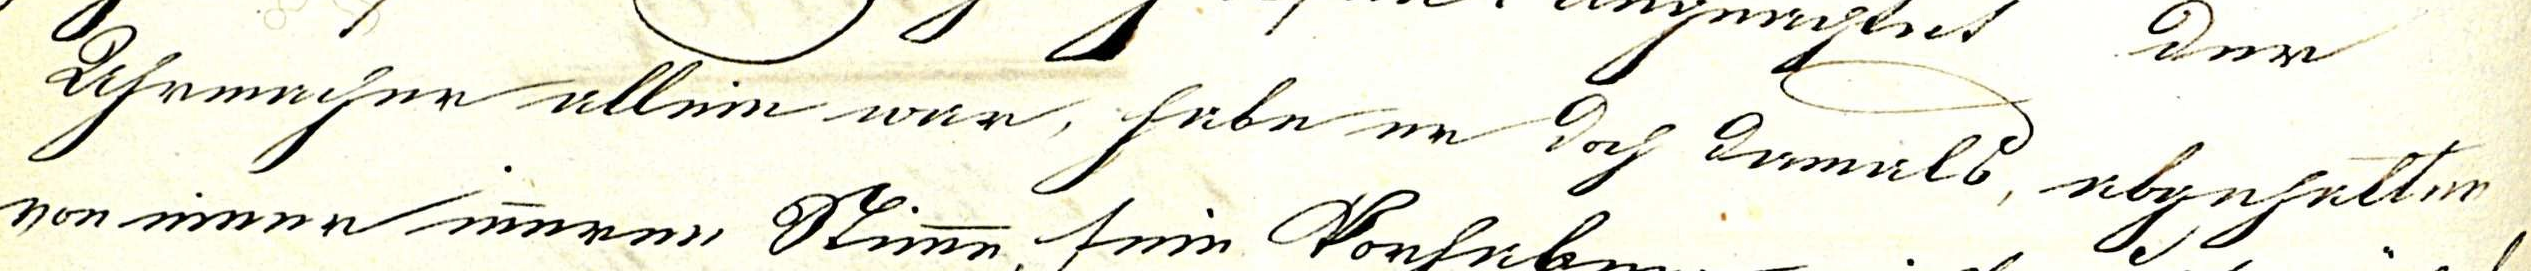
Uhrmacher allein war, habe er doch damals, abgehalten
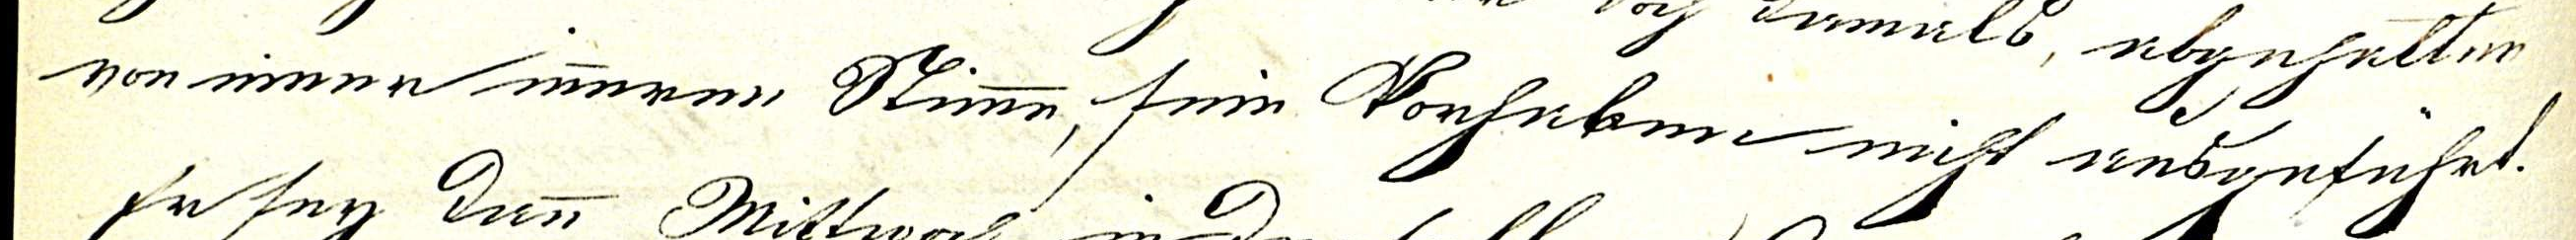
von einer inneren Stimme, sein Vorhaben nicht ausgeführt.
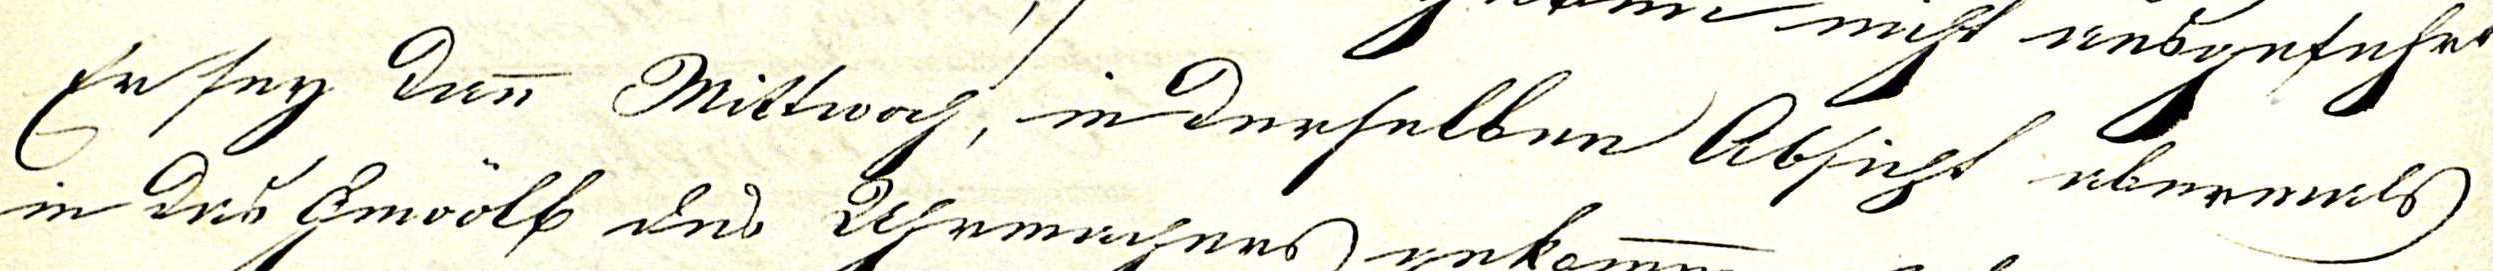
Er sey dann Mittwoch, in derselben Absicht abermals
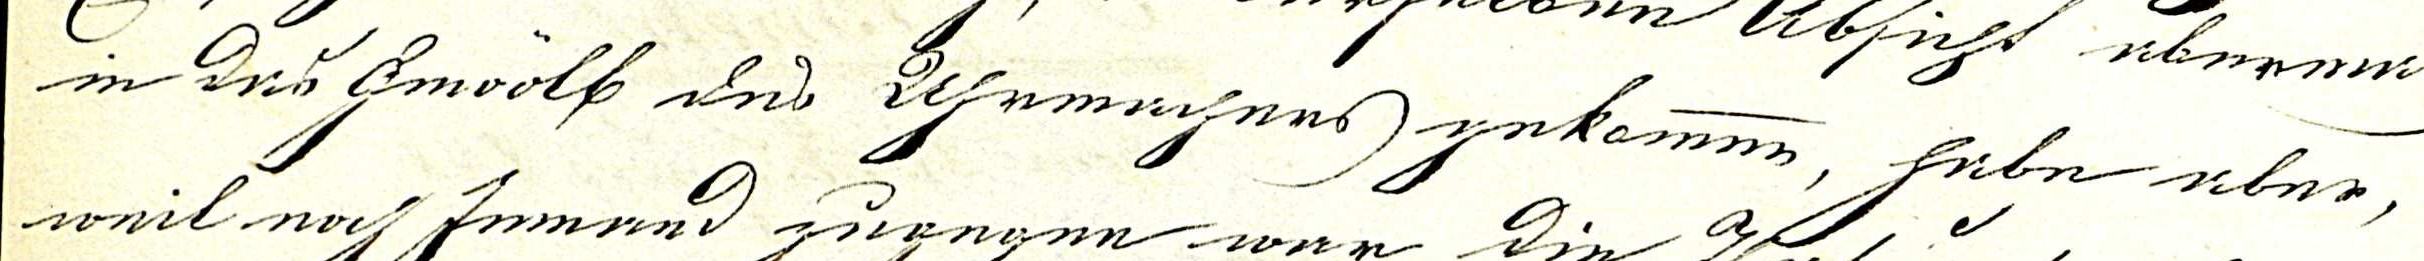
in das Gewölb des Uhrmachers gekommen, habe aber,
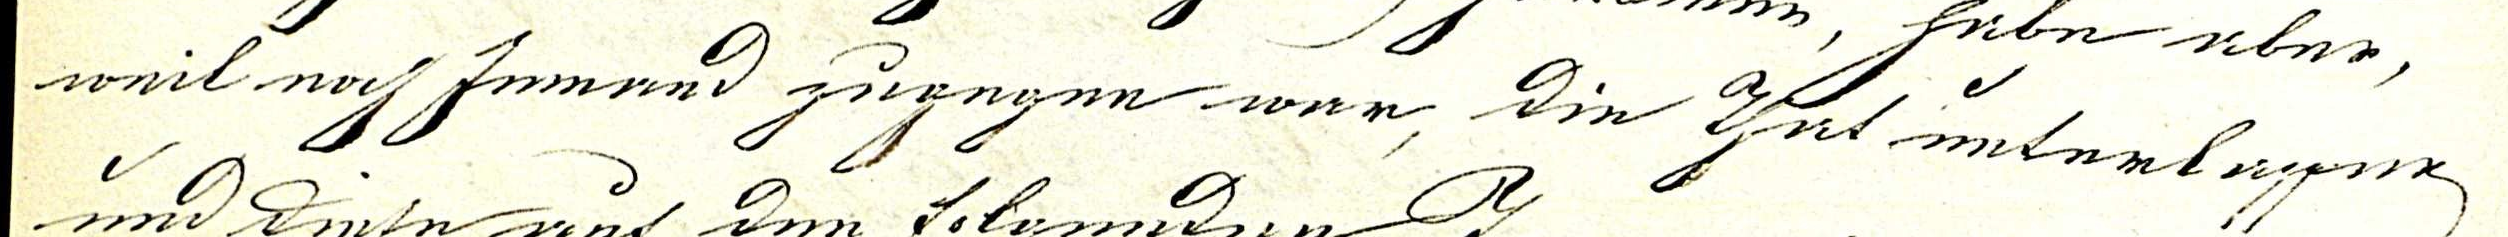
weil noch Jemand zugegen war, die That unterlassen
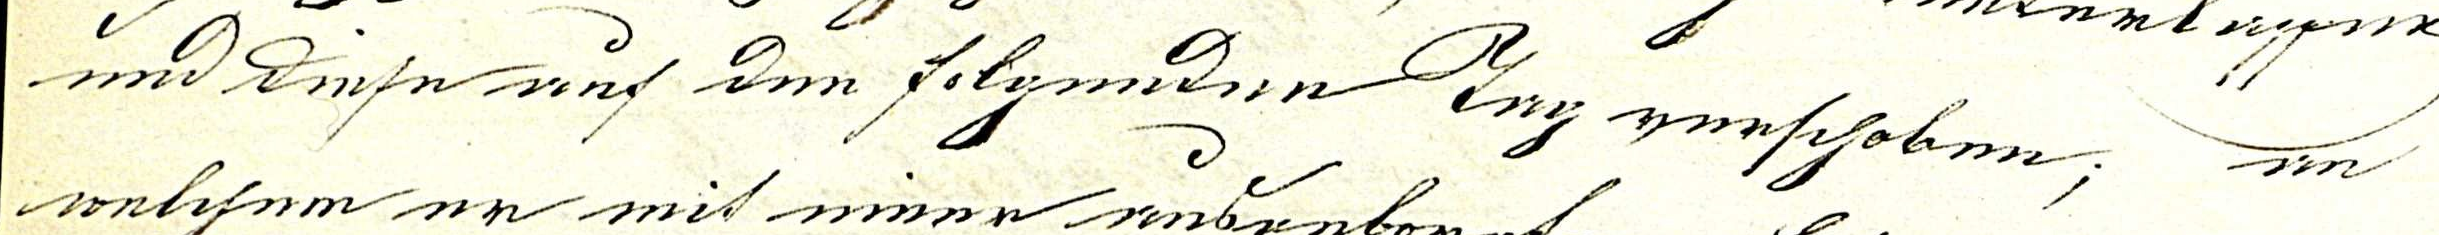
und diese auf den folgenden Tag verschoben; an
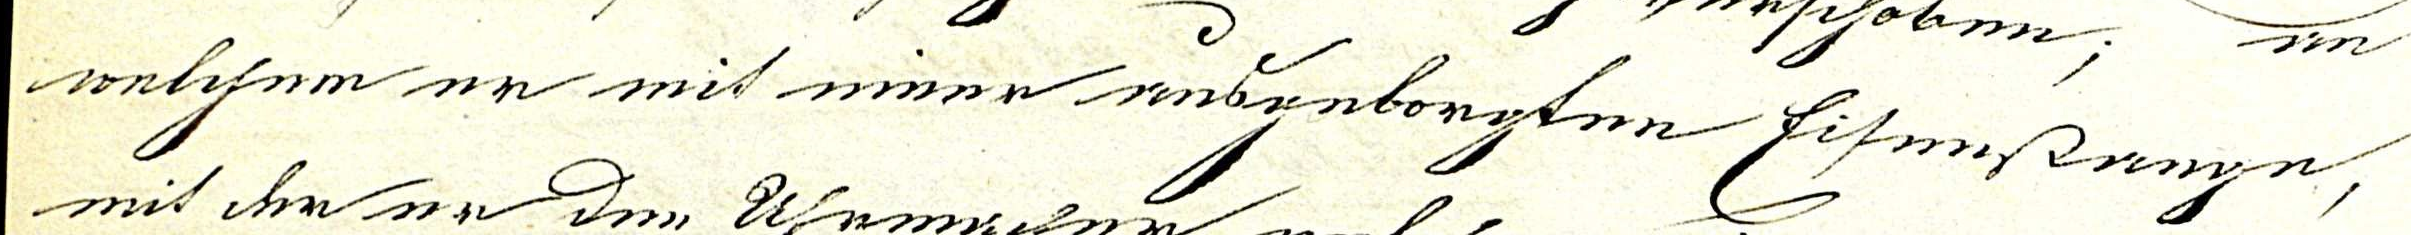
welchem er mit einer ausgeborgten Eisenstange,
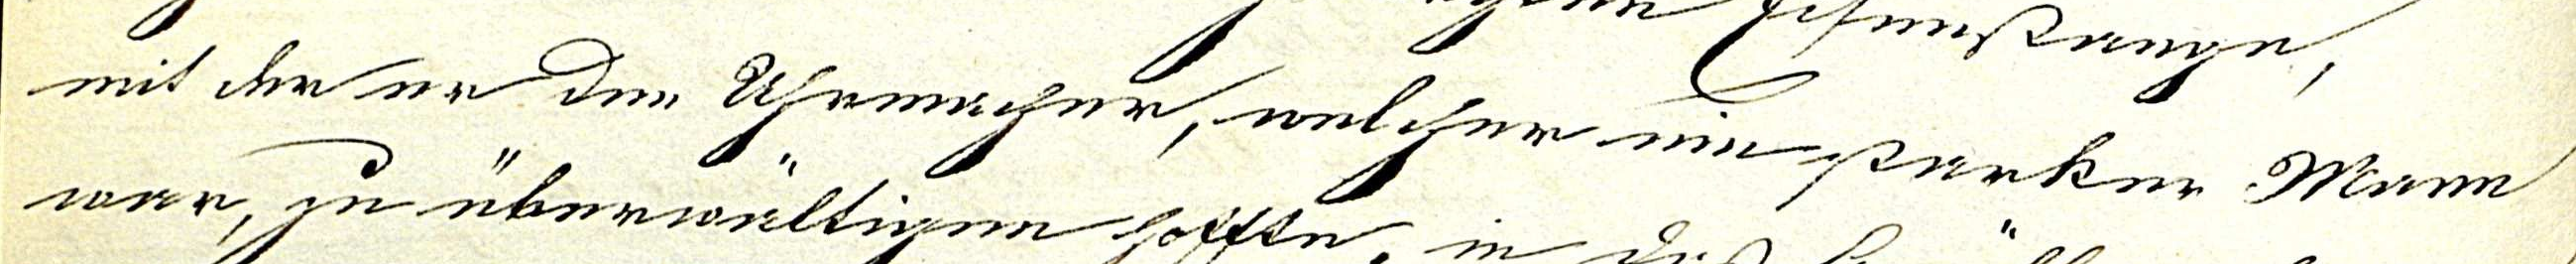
mit der er dem Uhrmacher, welcher ein starker Mann
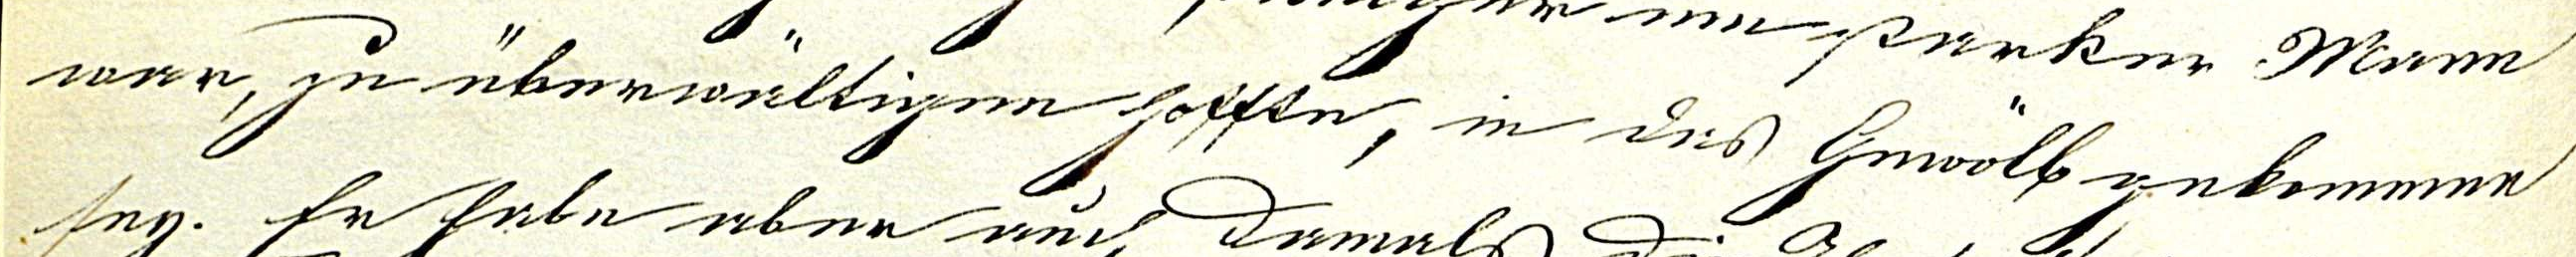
war, zu überwältigen hoffte, in das Gewölb gekommen
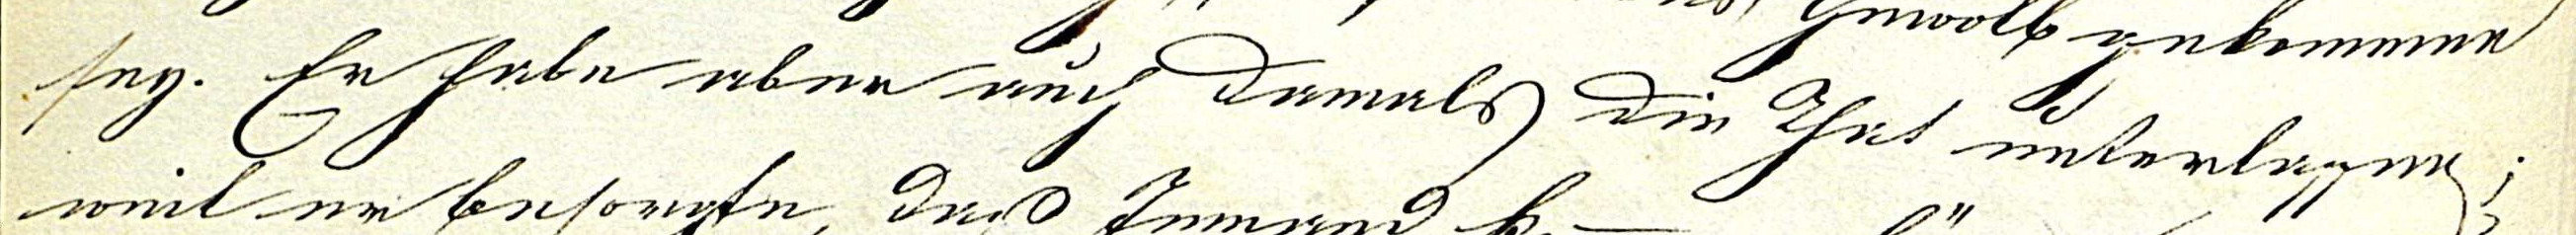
sey. Er habe aber auch damals die That unterlassen;
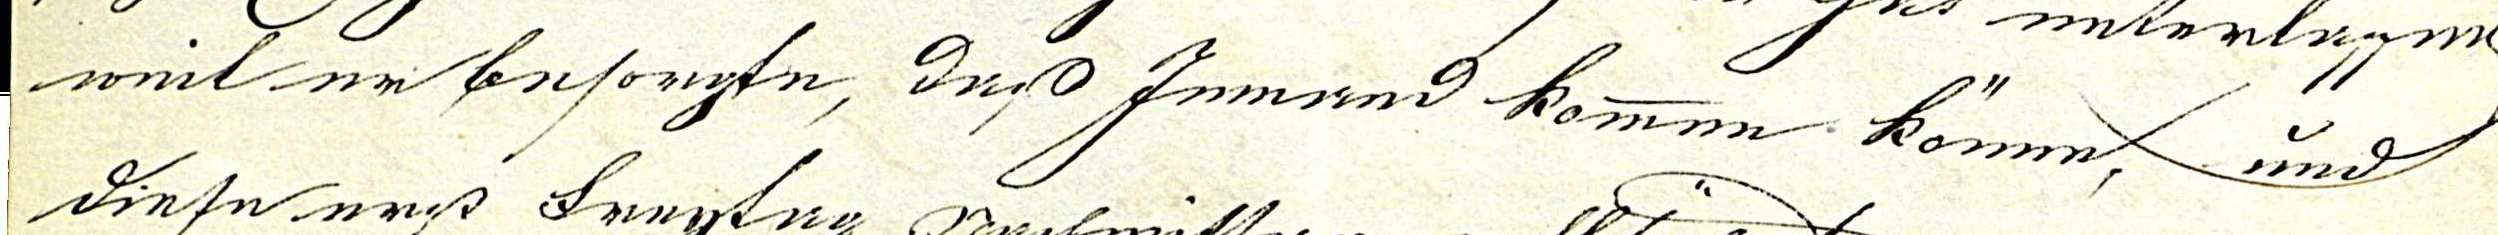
weil er besorgte, daß Jemand kommen könne, und
